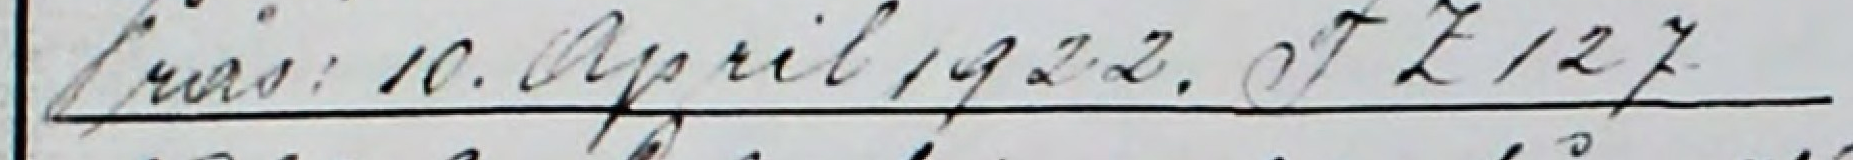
Präs: 10. April 1922. T Z 127.
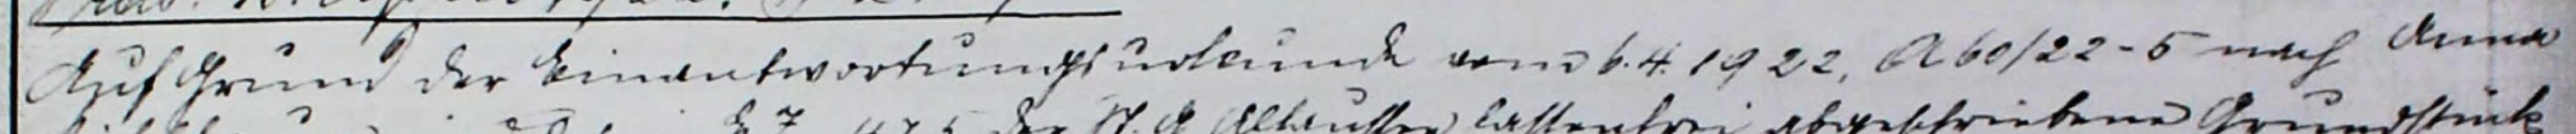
Auf Grund der Einantwortungsurkunde vom 6.4.1922. A 60/22 - 5 nach Anna
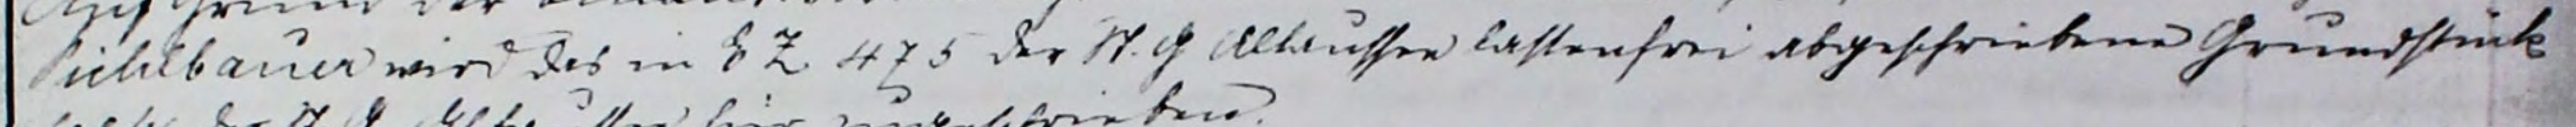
Pichlbauer wird das in E Z. 475 der St.G Altaussee lastenfrei abgeschriebene Grundstück
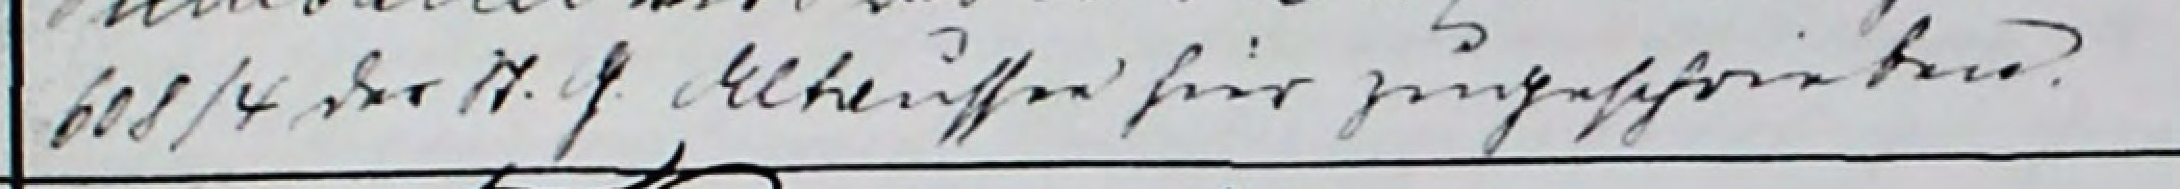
608/4 der St.G. Altaussee für zugeschrieben.
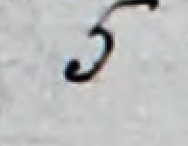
5
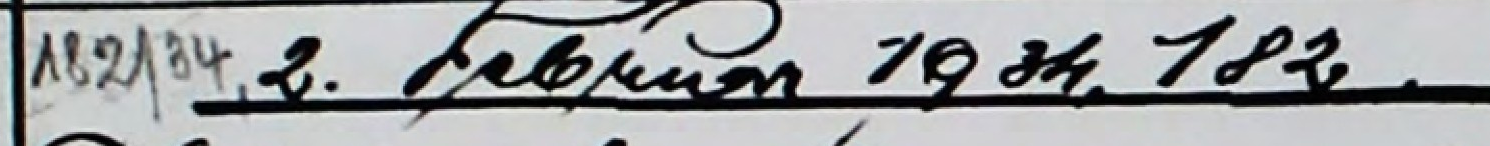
182/34, 2. Februar 1934. 182
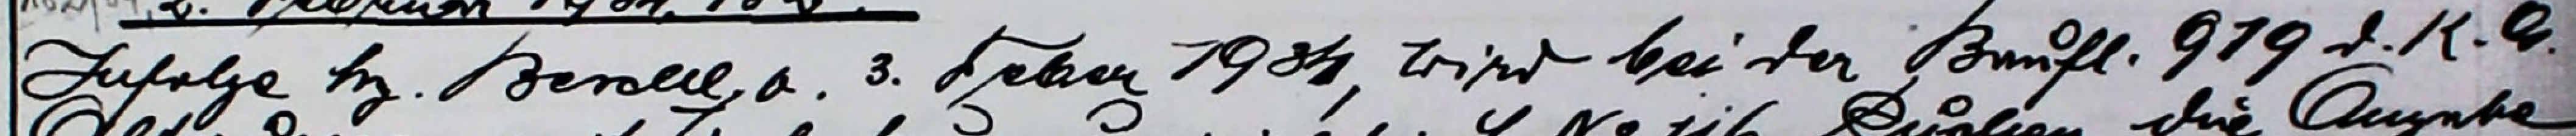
Zufolge hz. Bereld, v. 3. Feber 1934, wird bei der Baufl. 919 d.K.A.
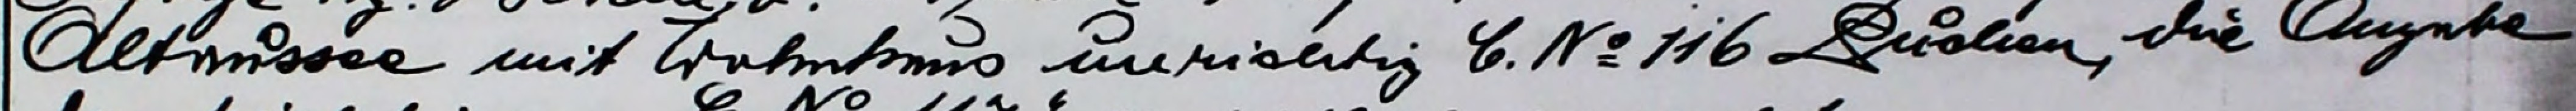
Altaussee mit Wohntmus unrichtig C. No 116 Puchen, die Angebe
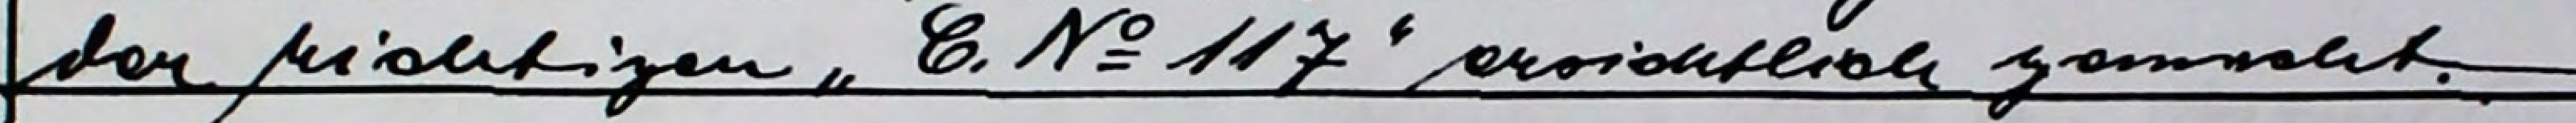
der richtigen „C. No 117“ ersichtlich gemacht.
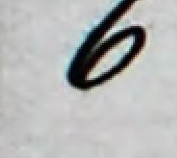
6
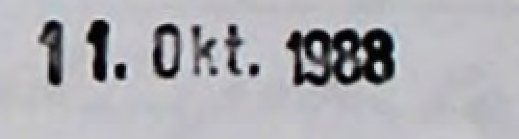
11. Okt. 1988
